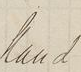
klaren.
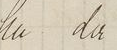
An der
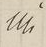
Ihrer
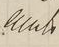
habe ich
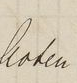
eine
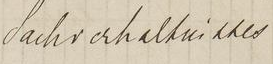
Sachverhältnisses
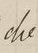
die er
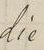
Er
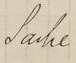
hatte
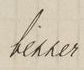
freilich
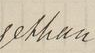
besser gethan
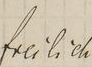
die Sache
